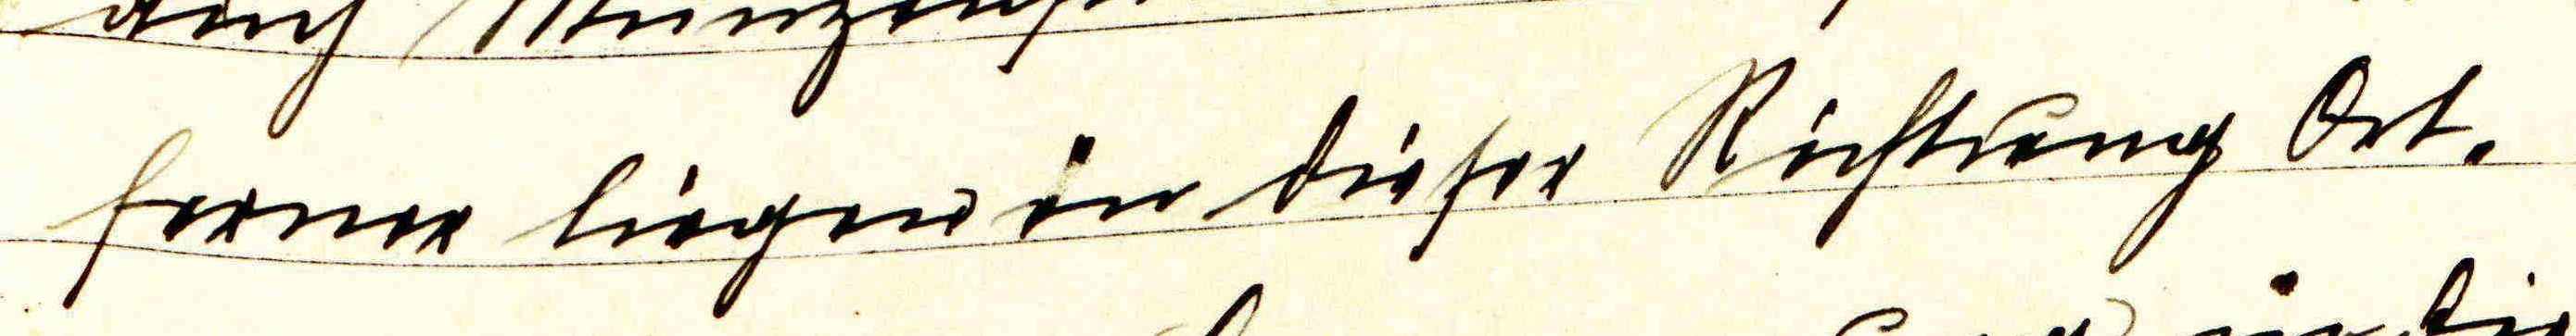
ferner liegen in dieser Richtung Ort-
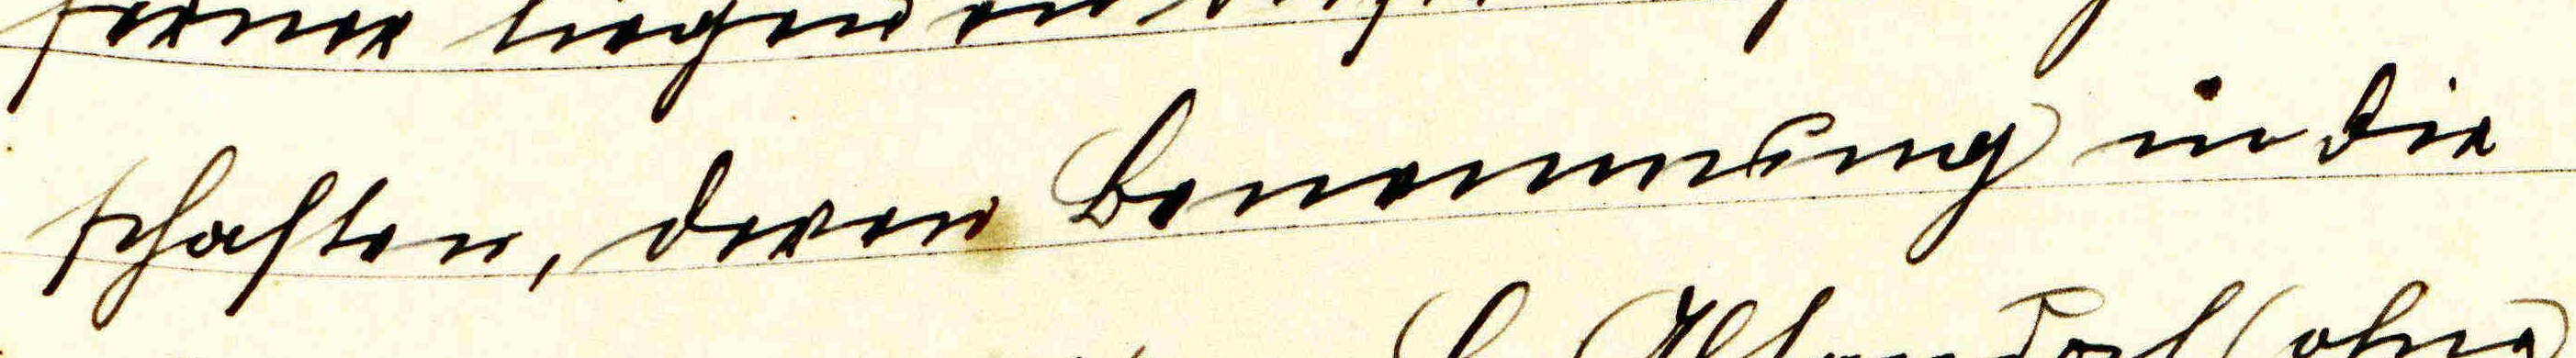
schaften, deren Benennung in die
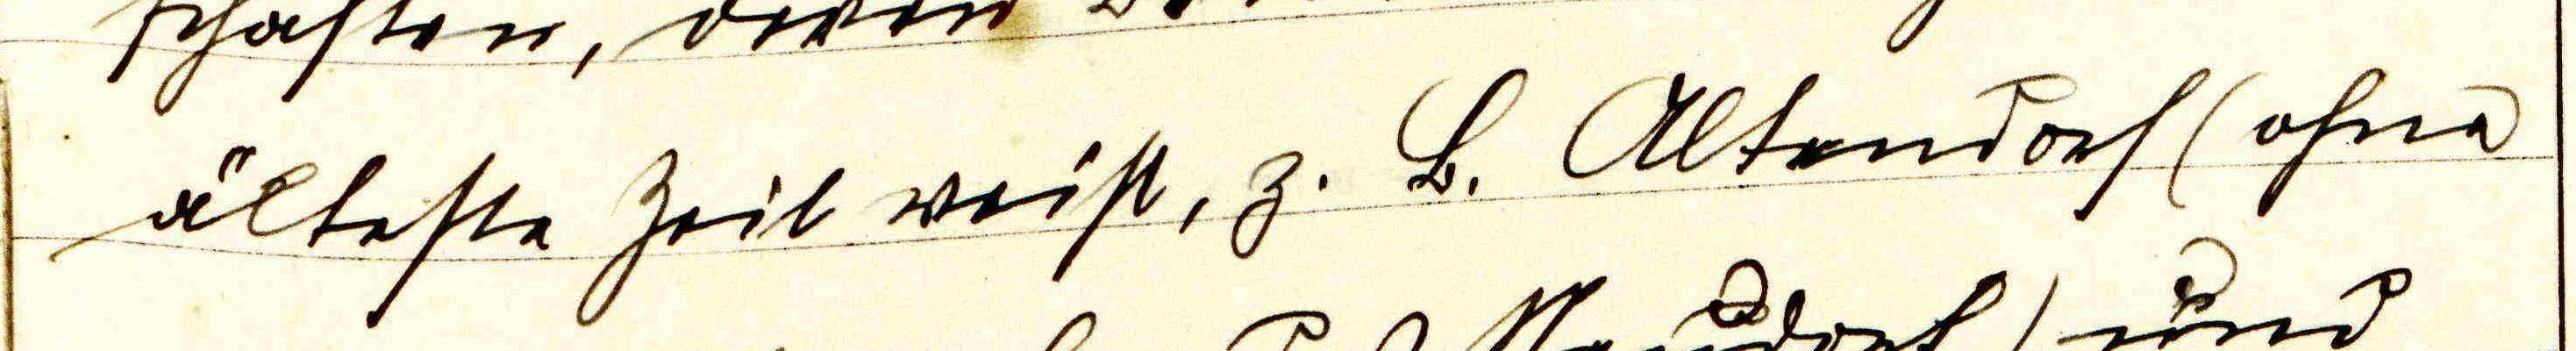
älteste Zeit weist, z.B. Altendorf (ohne
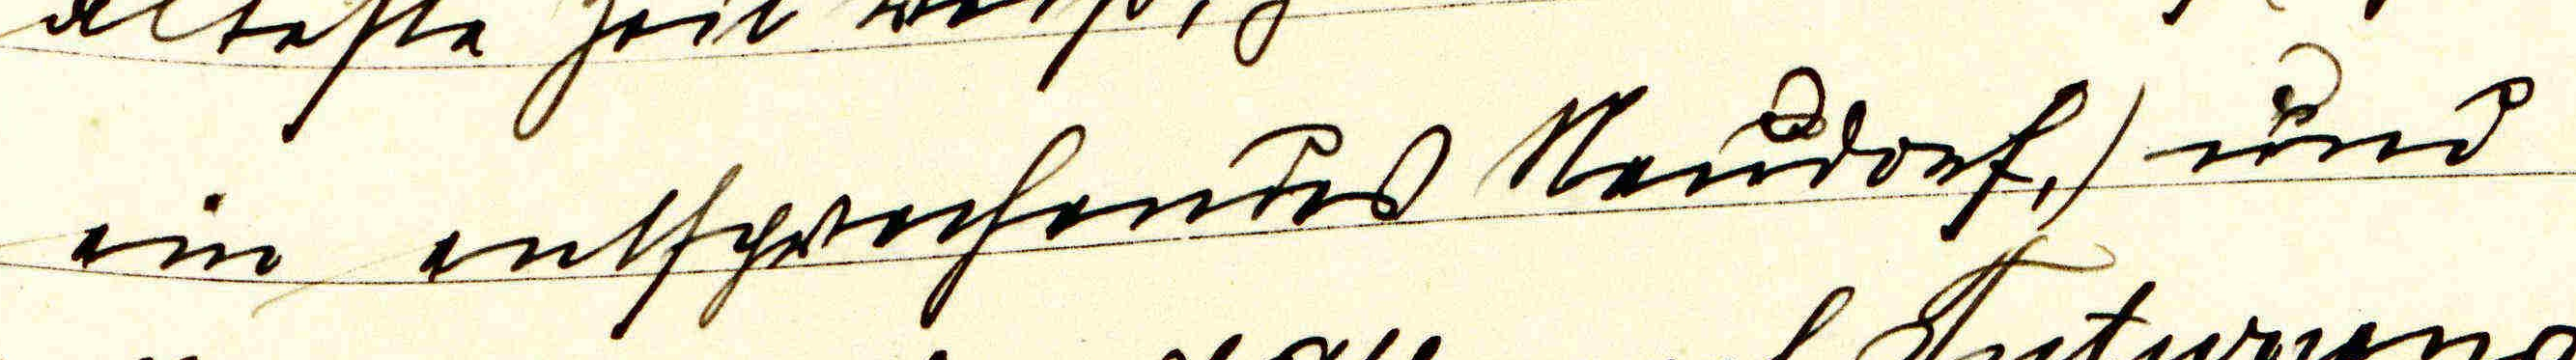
ein entsprechendes Neudorf,) und
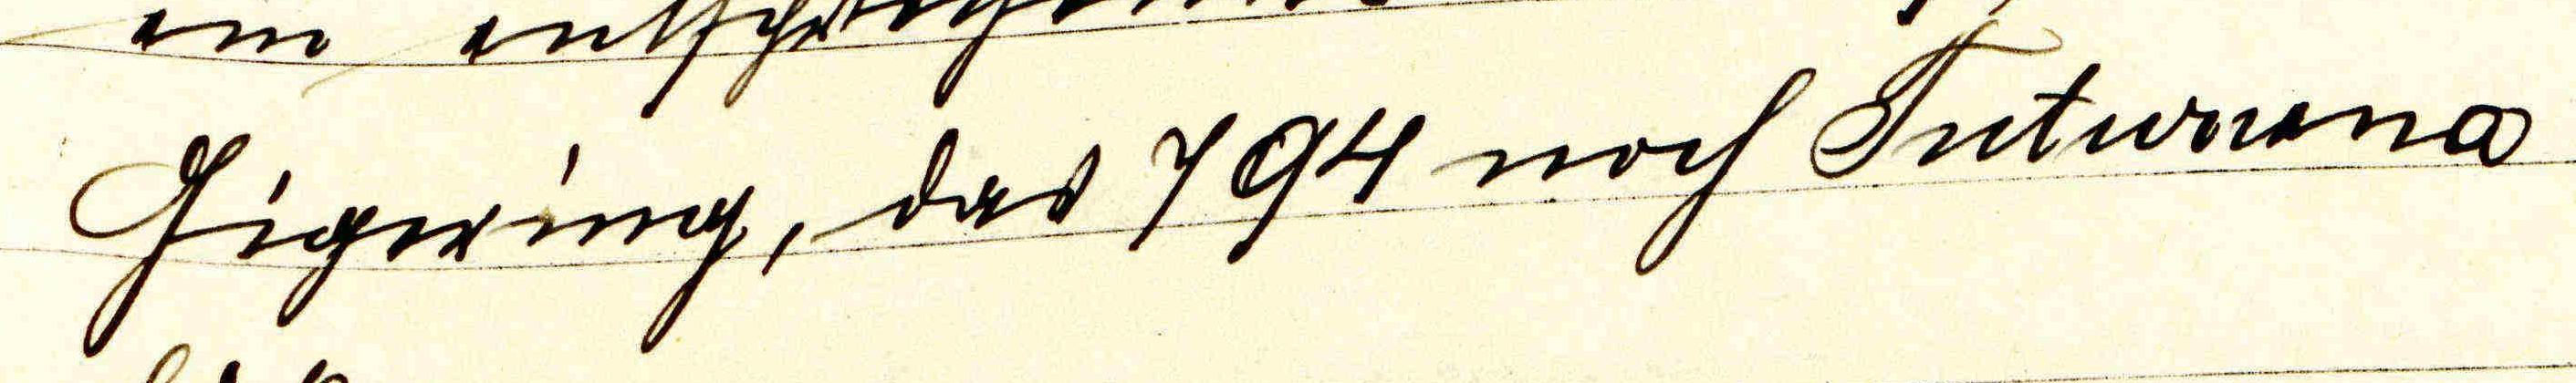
Gigering, das 794 noch ???
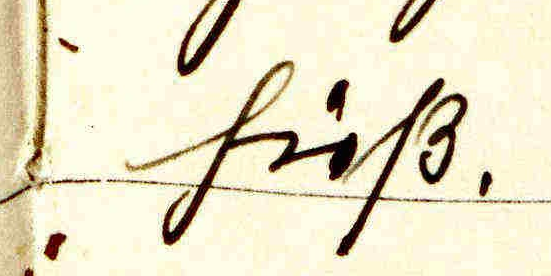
hieß.
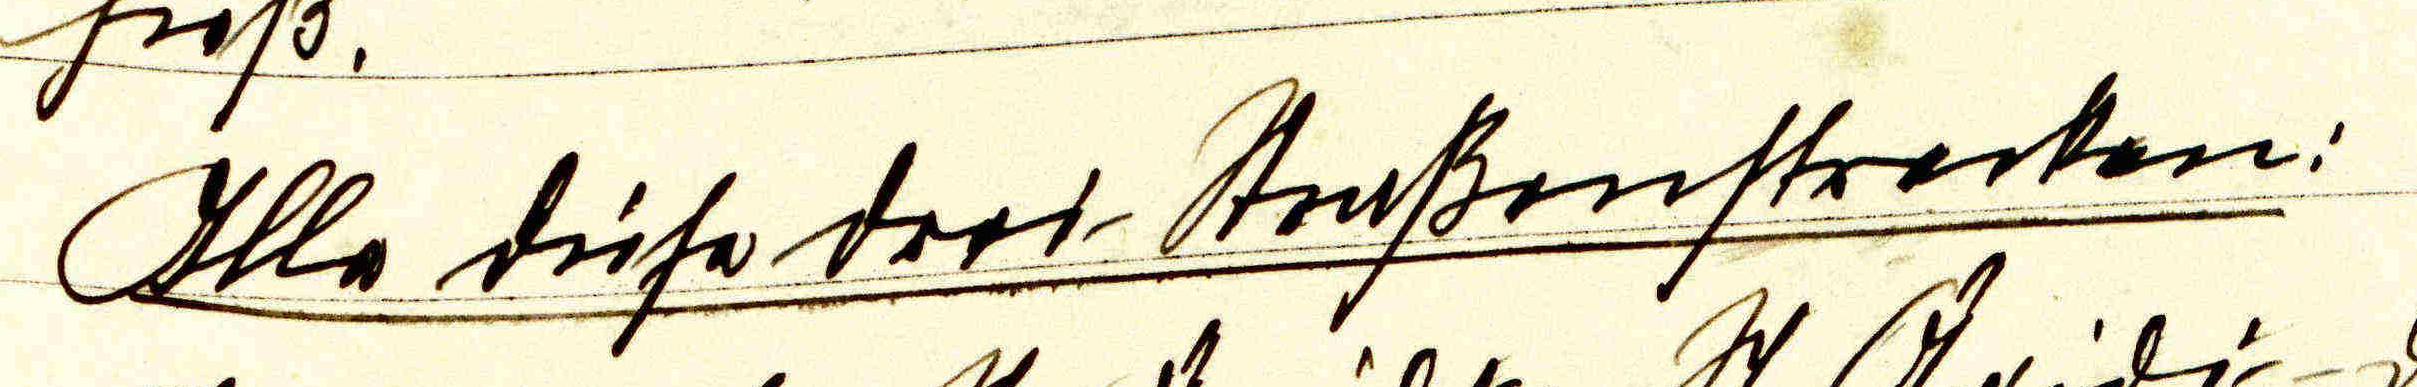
Alle diese drei Straßenstrecken:
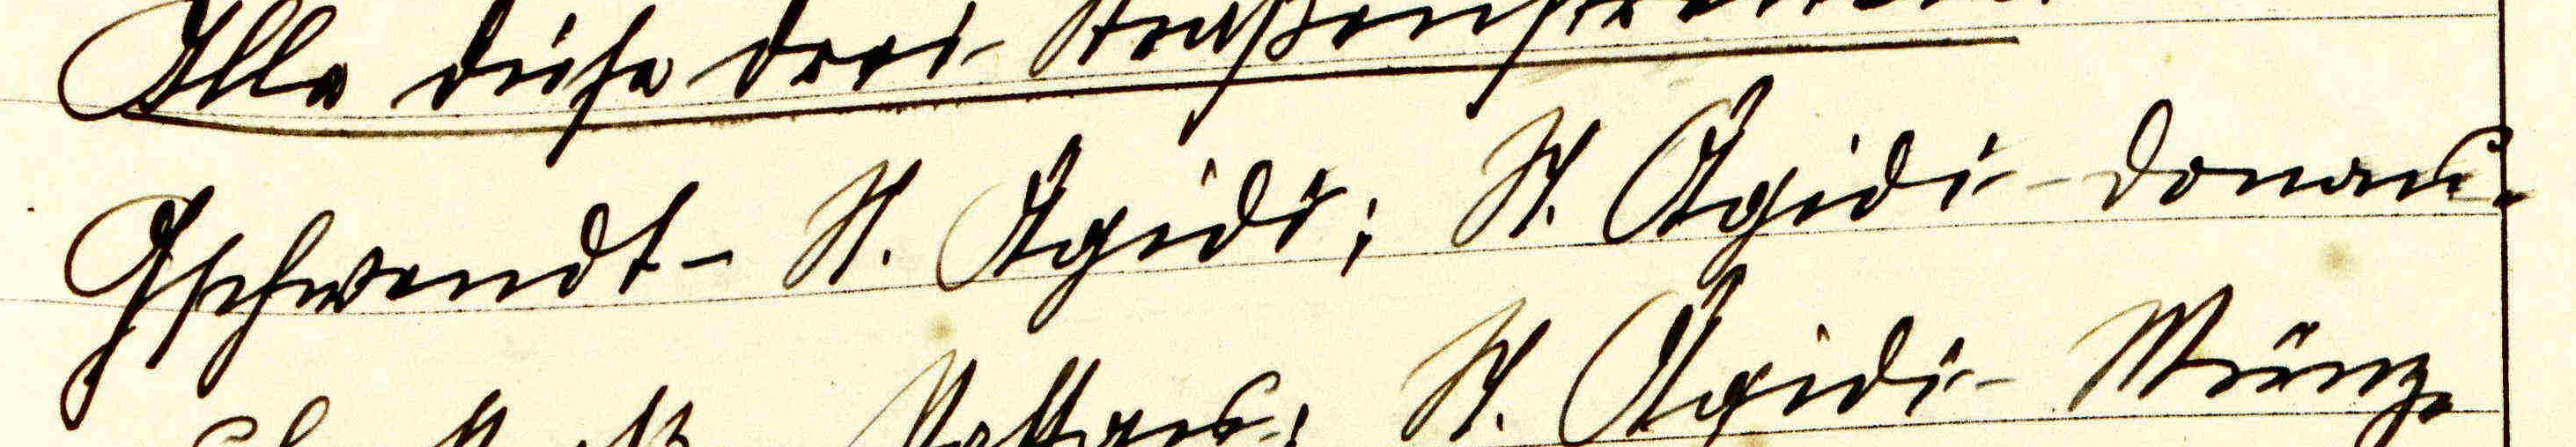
Gschwendt – St.Ägidi; St. Ägidi – Donau-
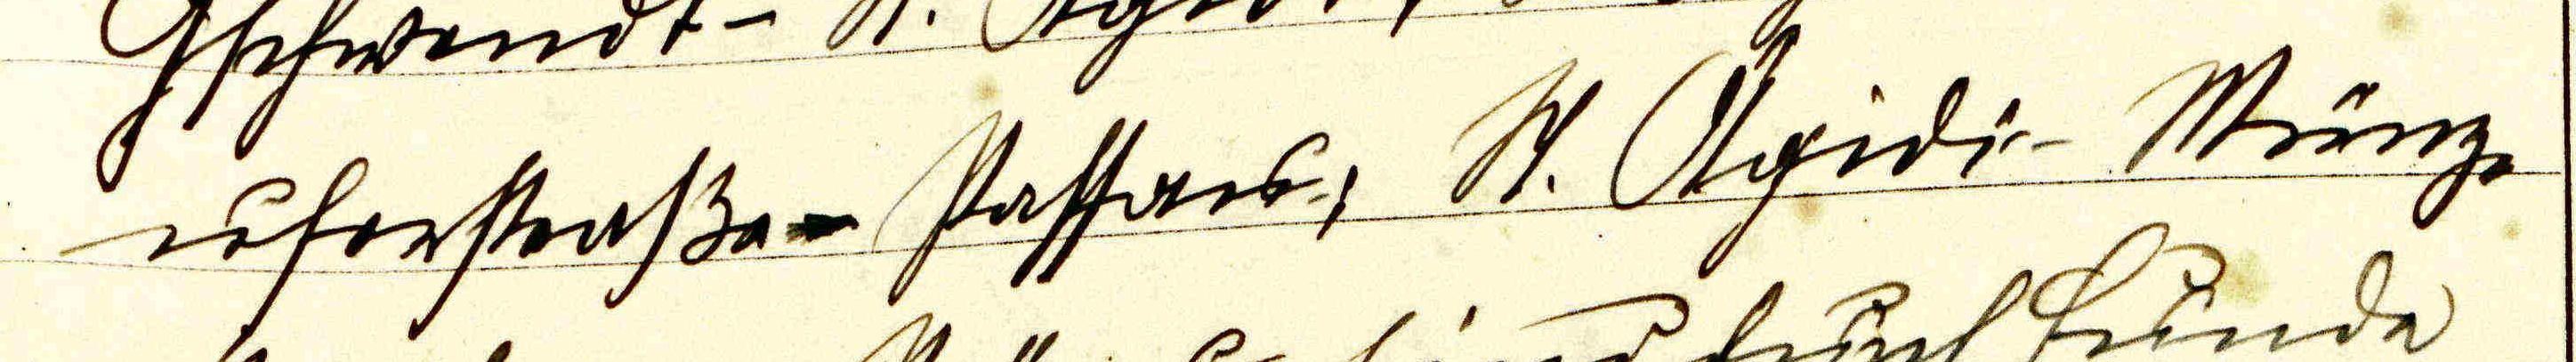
uferstraße – Passau, St. Ägidi – Münz-
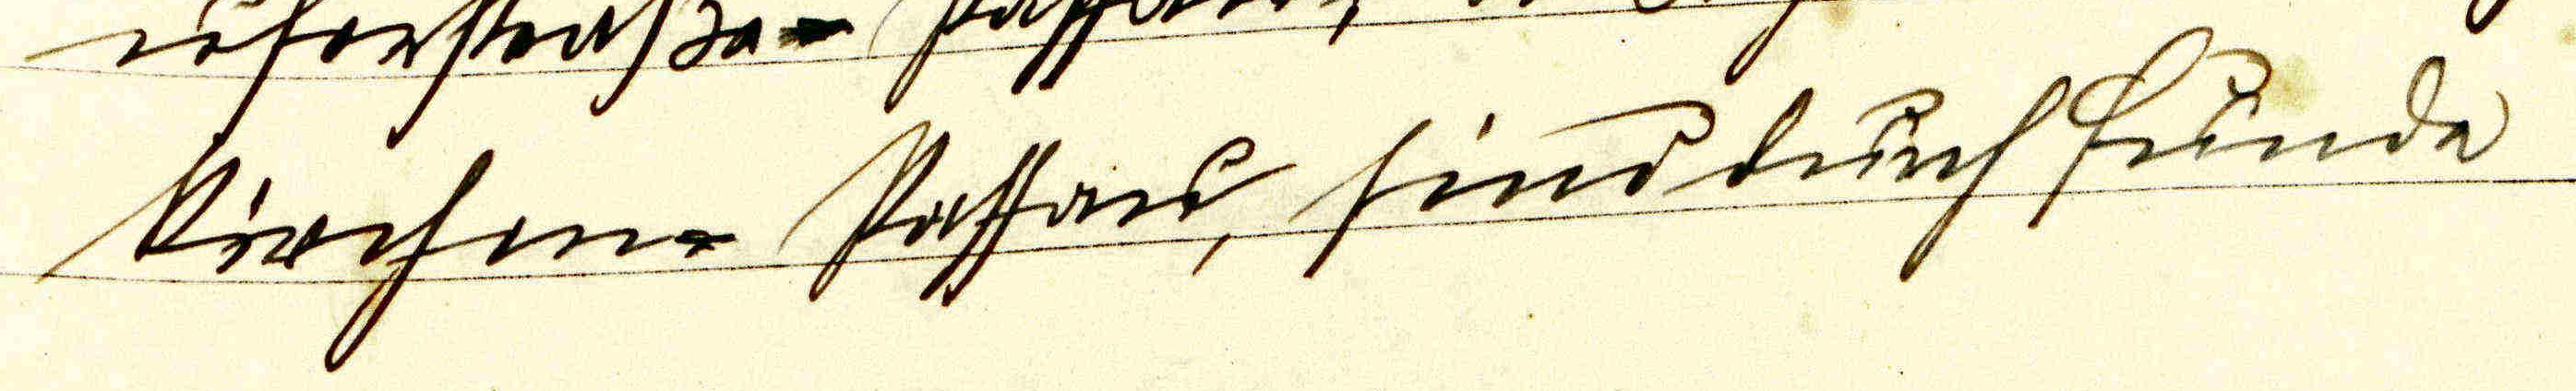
kirchen – Passau, sind durch Funde
